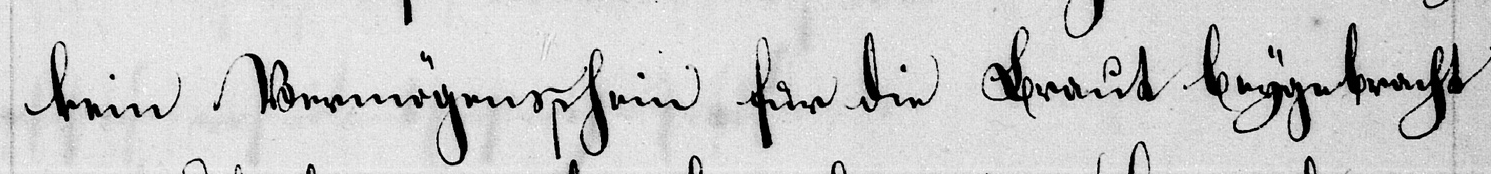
kein Vermögensschein für die Braut beygebracht
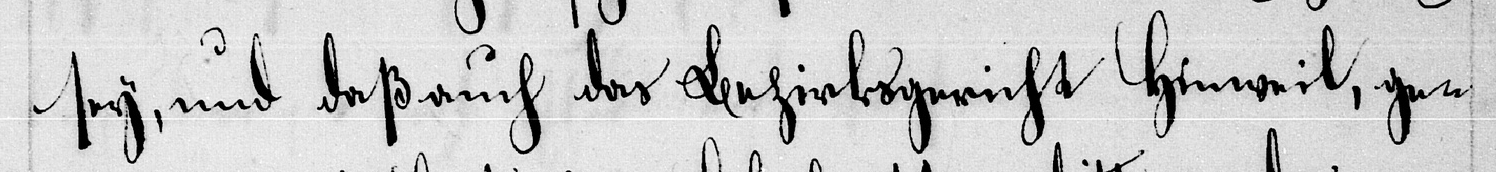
sey, und daß auch das Bezirksgericht Hinweil, ge¬
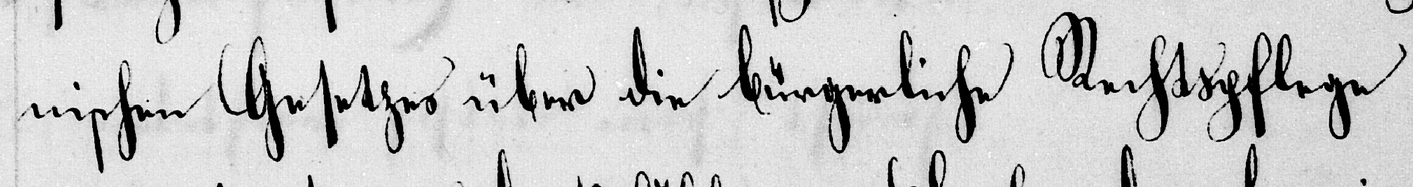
nischen Gesetzes über die bürgerliche Rechtspflege
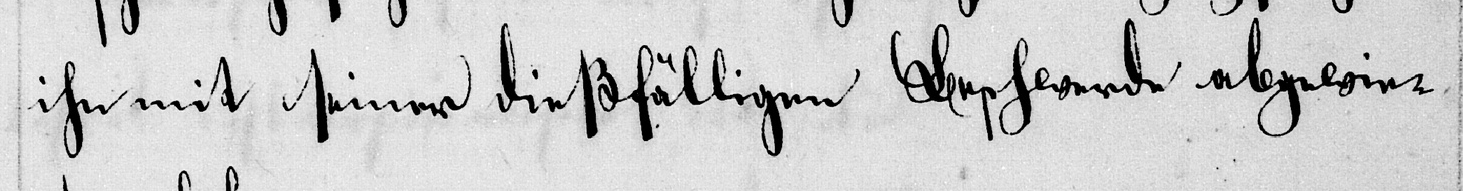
ihn mit seiner dießfälligen Beschwerde abgewie¬
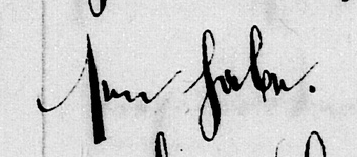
sen habe.
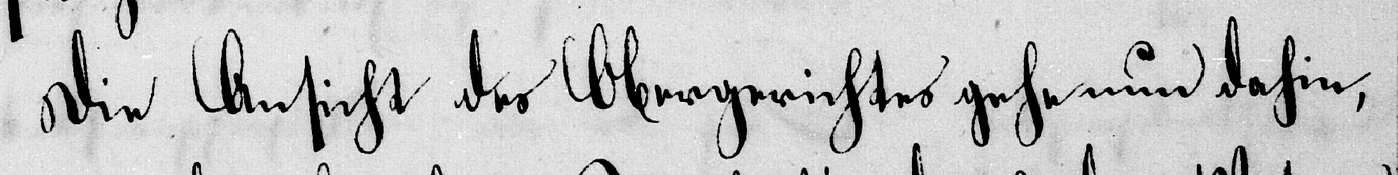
Die Ansicht des Obergerichtes gehe nun dahin,
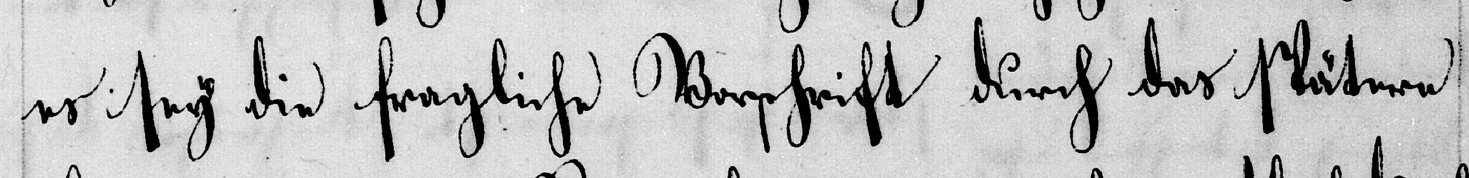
es sey die fragliche Vorschrift durch das spätere
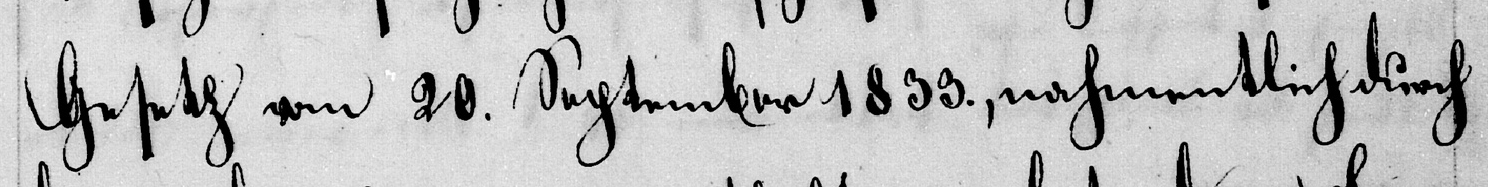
Gesetz vom 20. September 1833., nahmentlich durch
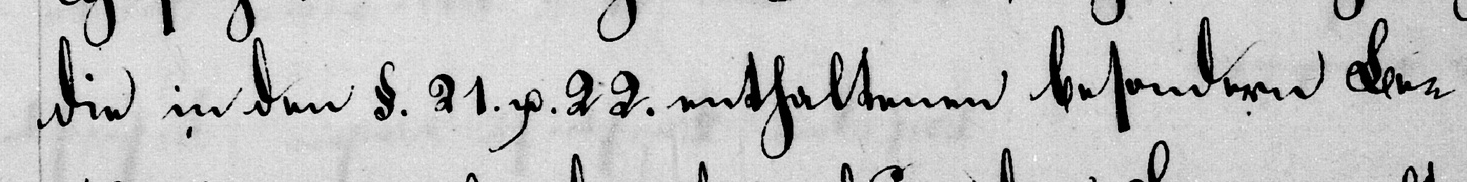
die in den §. 21 u. 22. enthaltenen besondern Be¬
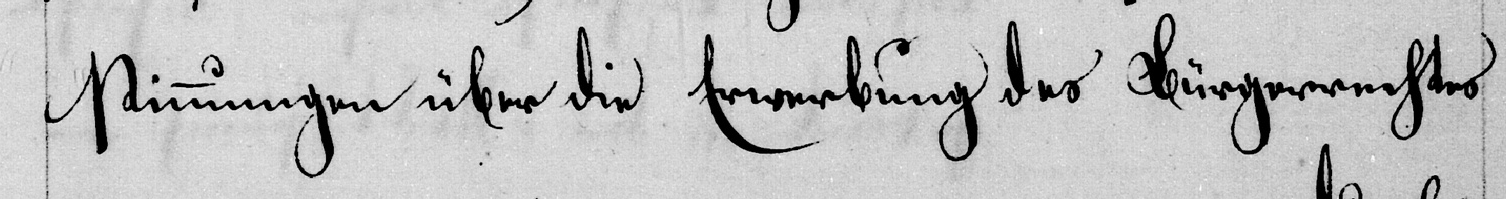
stimmungen über die Erwerbung des Bürgerrechtes
